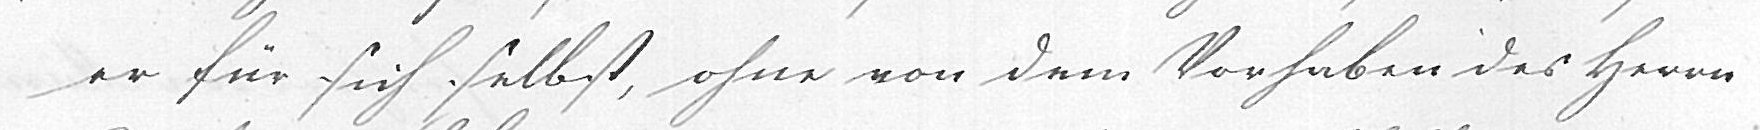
er für sich selbst, ohne von dem Vorhaben des Herrn
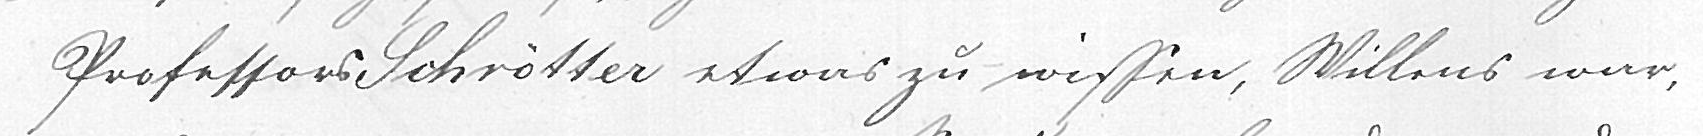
Professors Schrötter etwas zu wissen, Willens war,
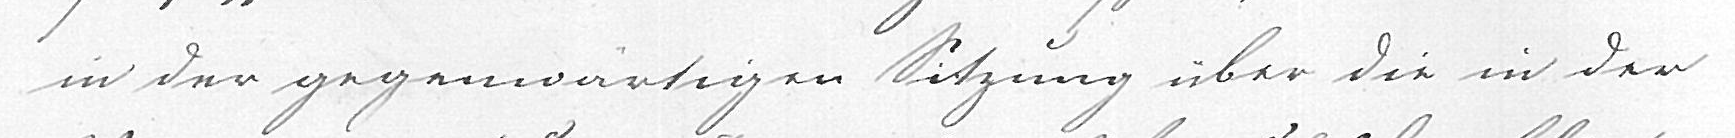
in der gegenwärtigen Sitzung über die in der
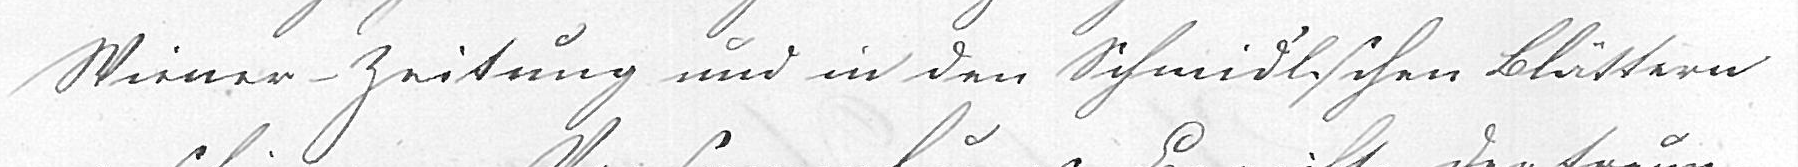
Wiener-Zeitung und in den Schmid'lschen Blättern
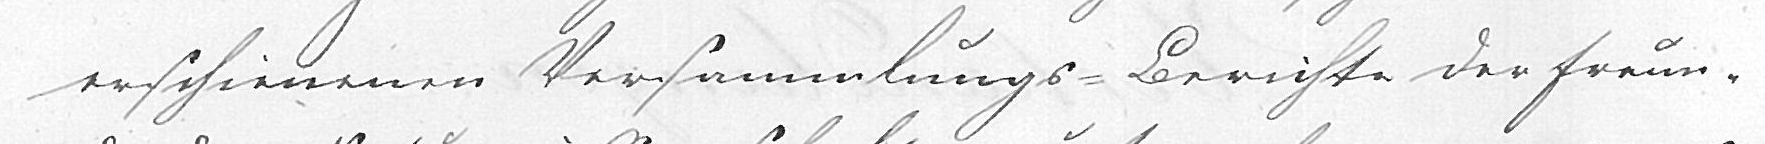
erschienenen Versammlungs-Berichte der Freun-
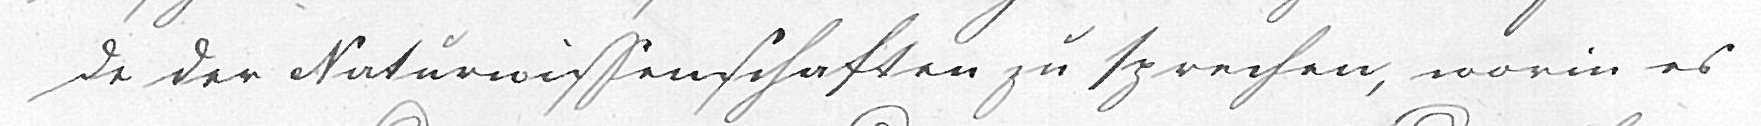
de der Naturwissenschaften zu sprechen, worin es
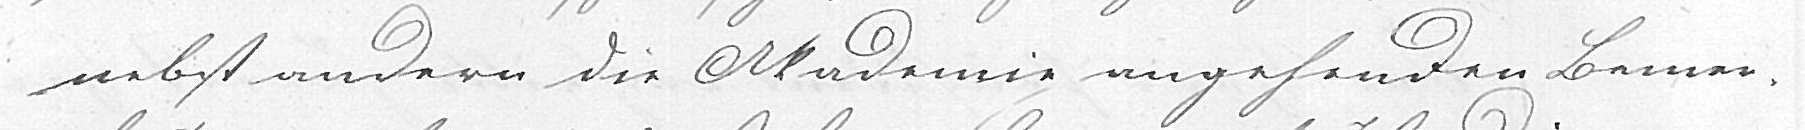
nebst andern die Akademie angehenden Bemer-
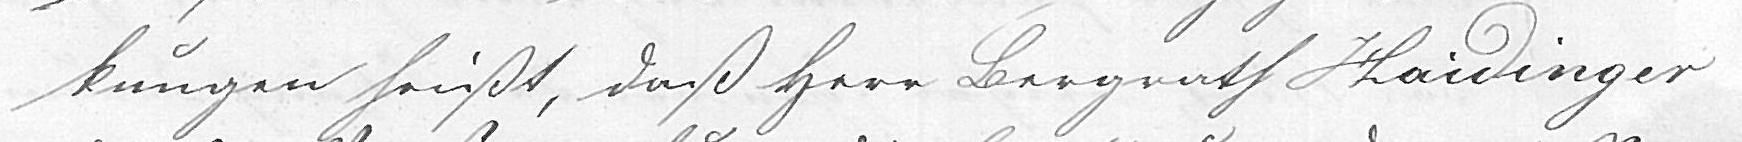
kunden heißt, daß Herr Bergrath Haidinger
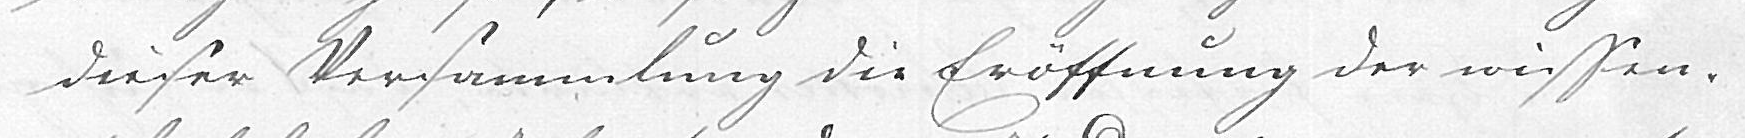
dieser Versammlung die Eröffnung der wissen-
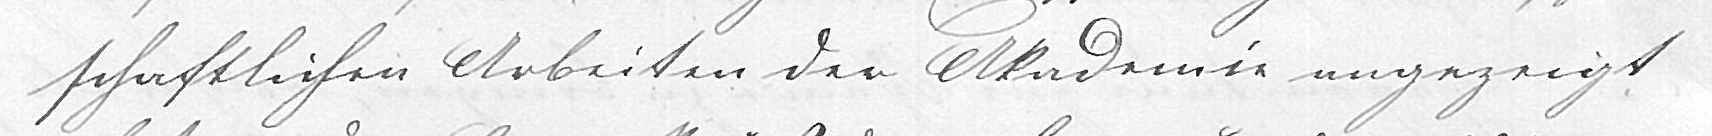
schaftlichen Arbeiten der Akademie angezeigt
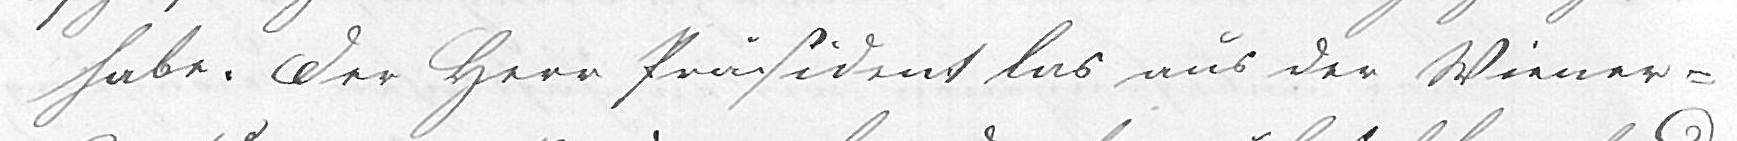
habe. Der Herr Präsident las aus der Wiener
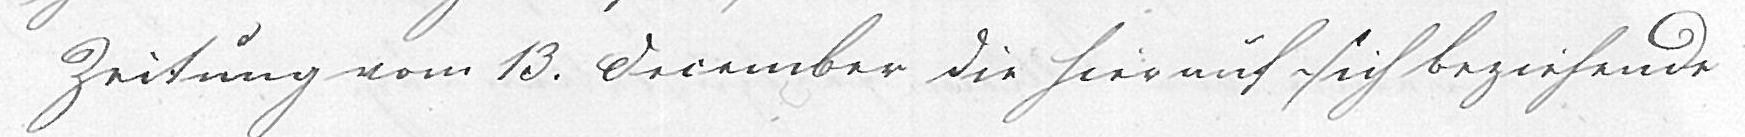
Zeitung vom 13. December die hierauf sich beziehende
